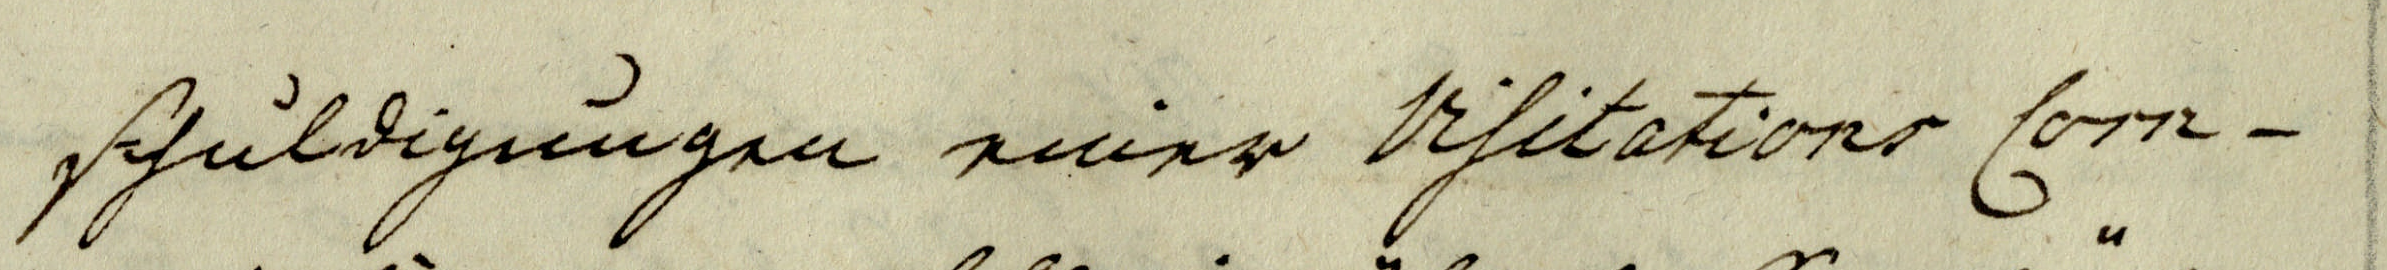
schuldigungen einer Visitations Com¬
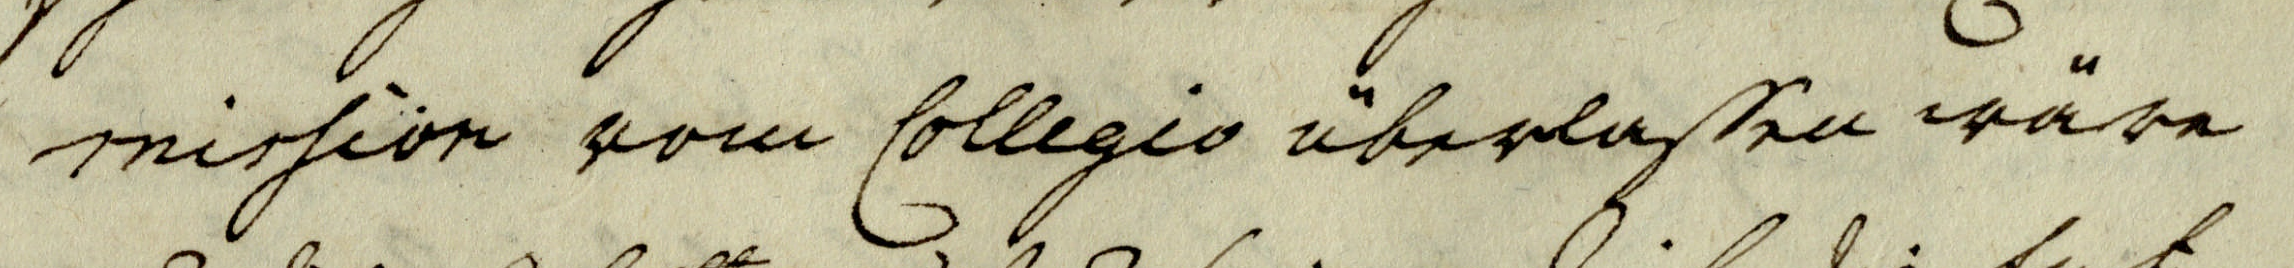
mission vom Collegio überlassen wäre
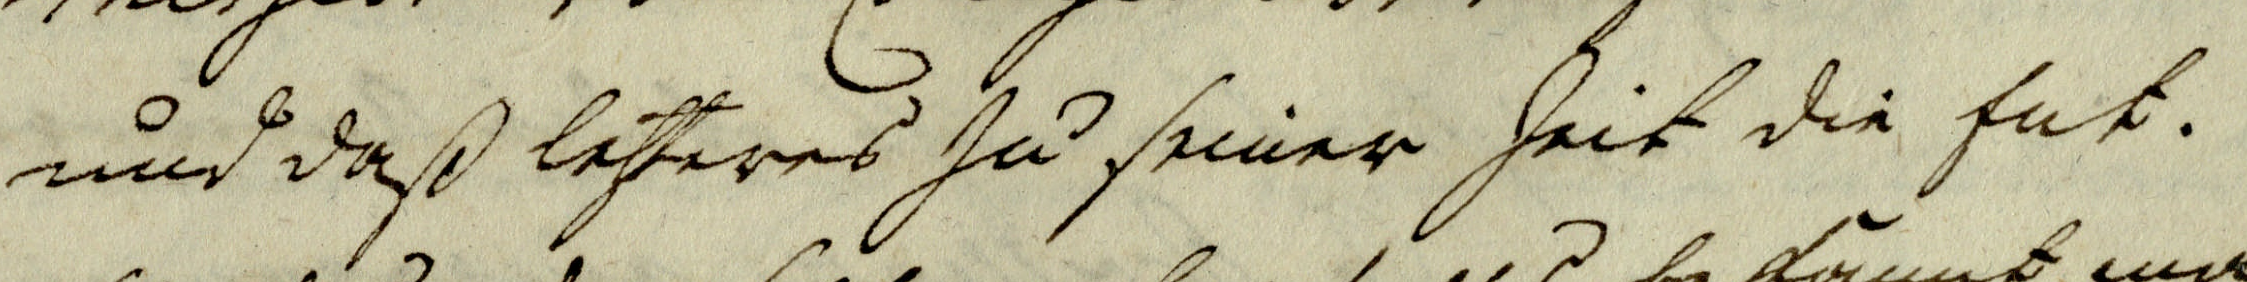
und daß letzteres zu seiner Zeit die Ent¬
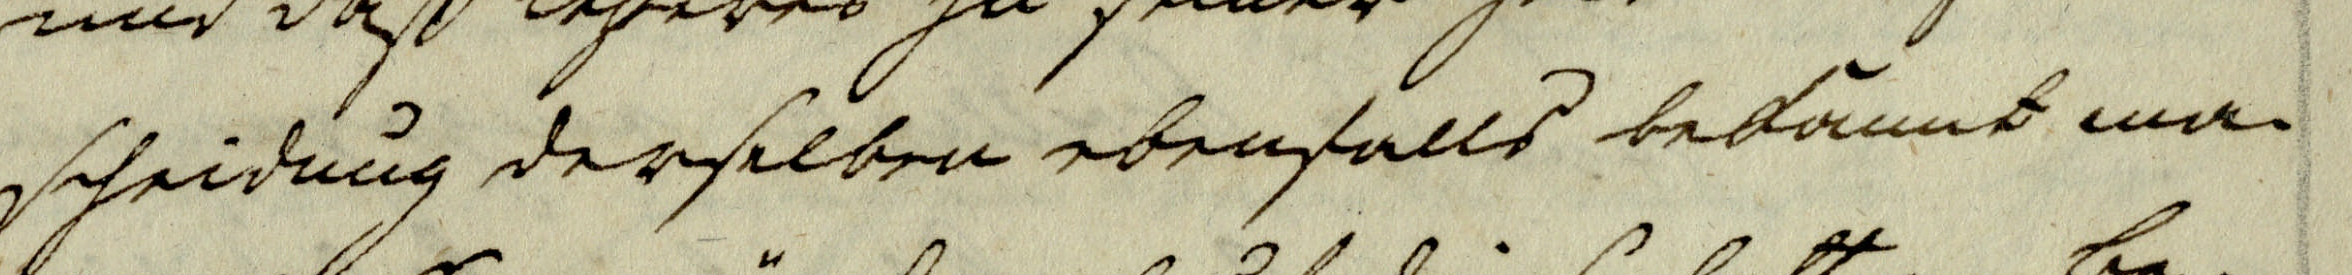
scheidung derselben ebenfalls bekannt ma¬
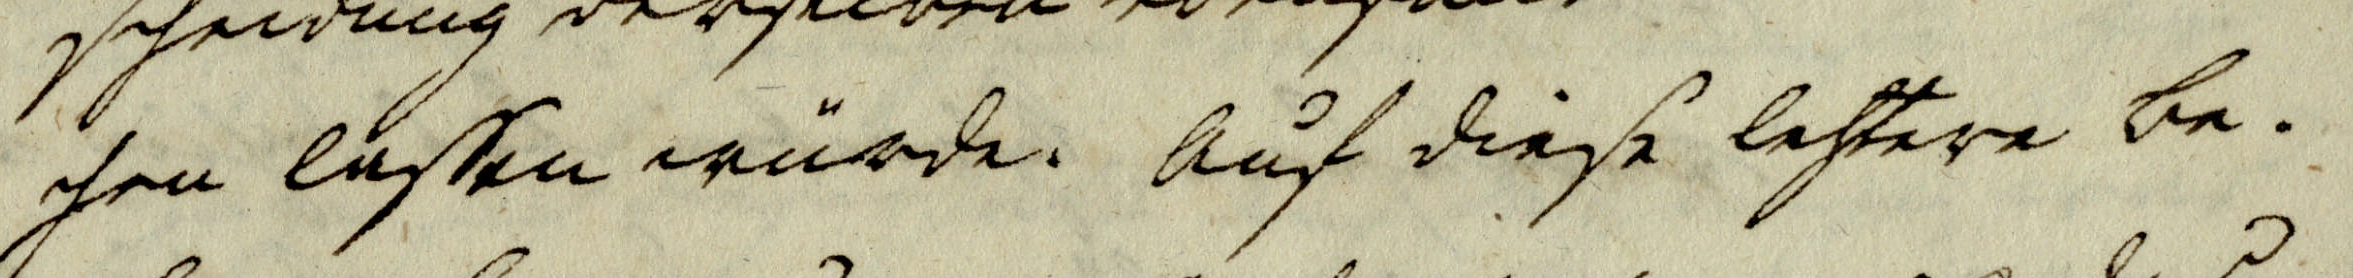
chen lassen würde. auf diese letztere Be¬
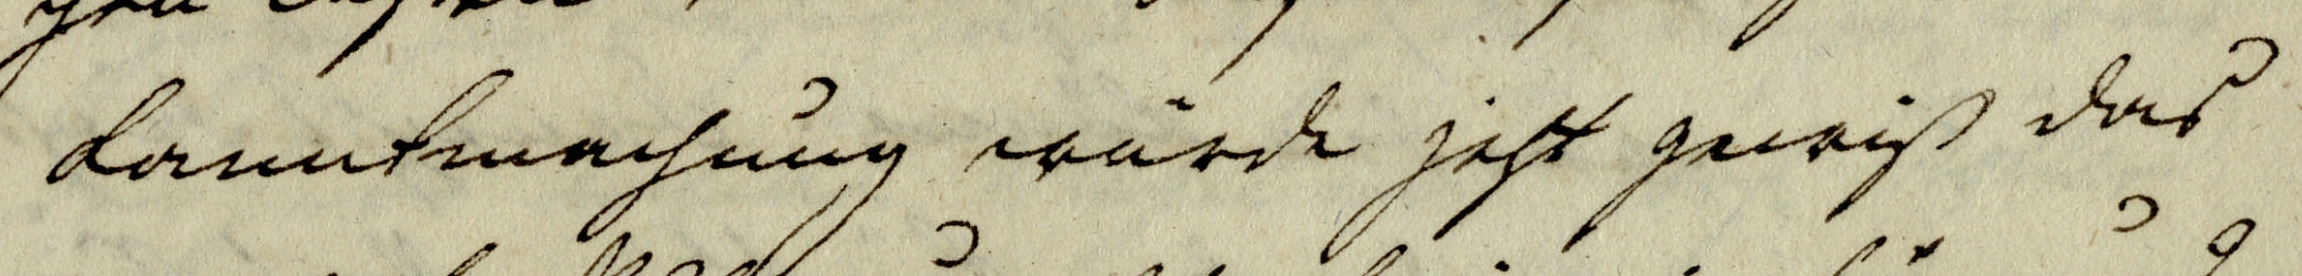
kanntmachung würde jetzt gewiß das
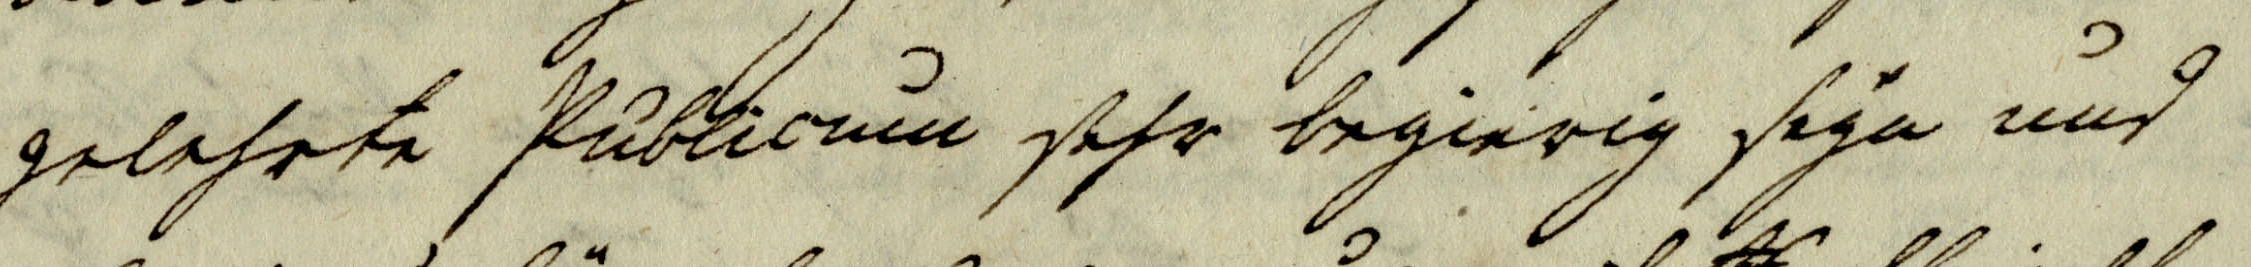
gelehrte Publicum sehr begierig seÿn und
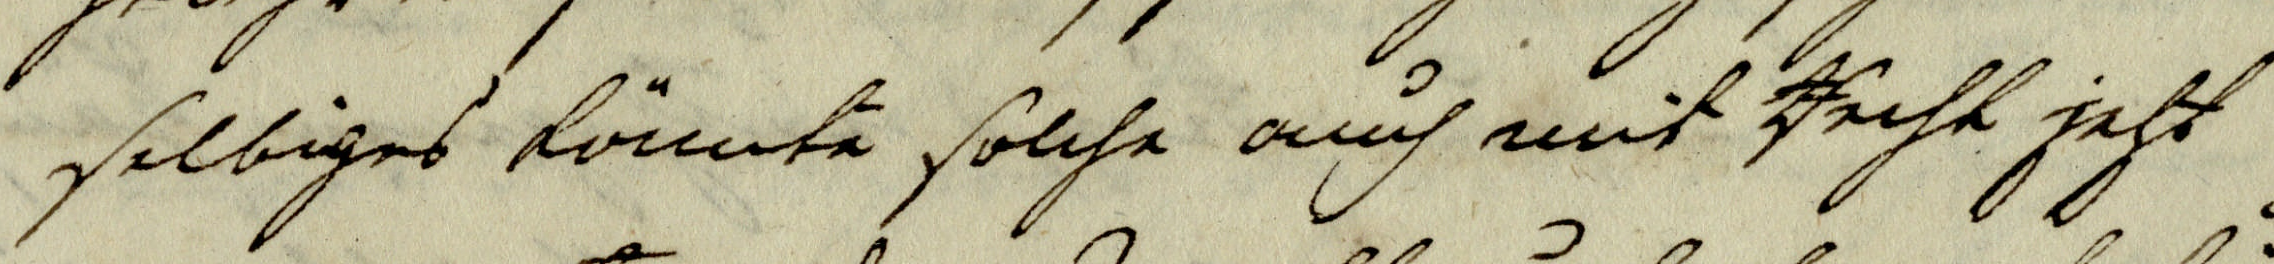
selbiges könnte solche auch mit Recht jetzt
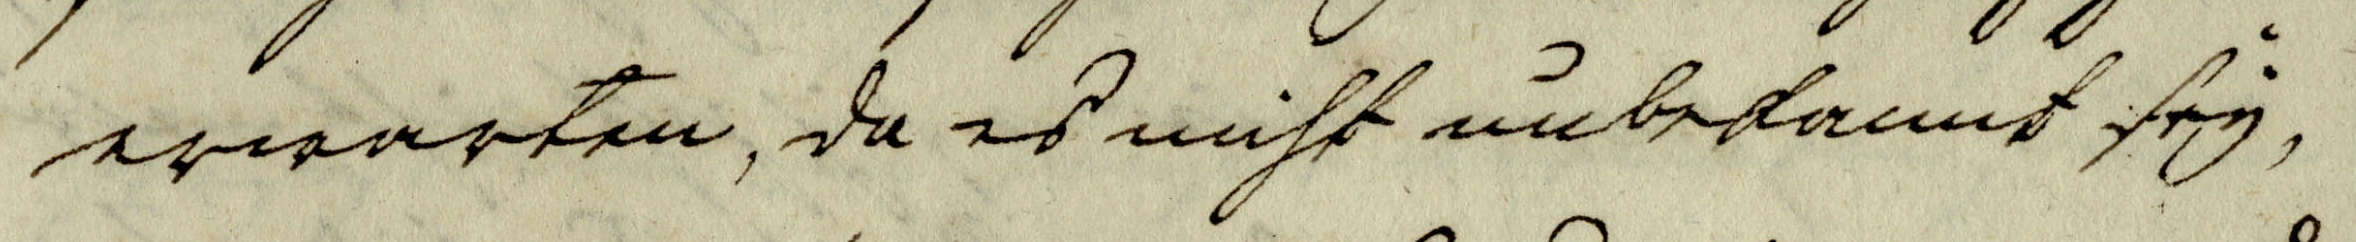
erwarten, da es nicht unbekannt seÿ,
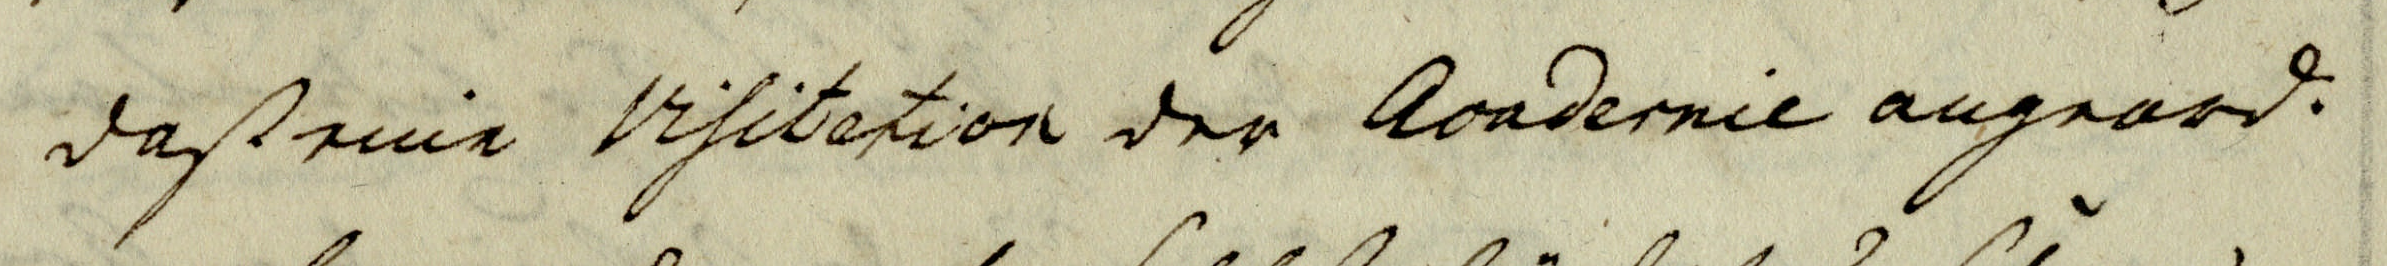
daß eine Visitation der Academie angeord¬
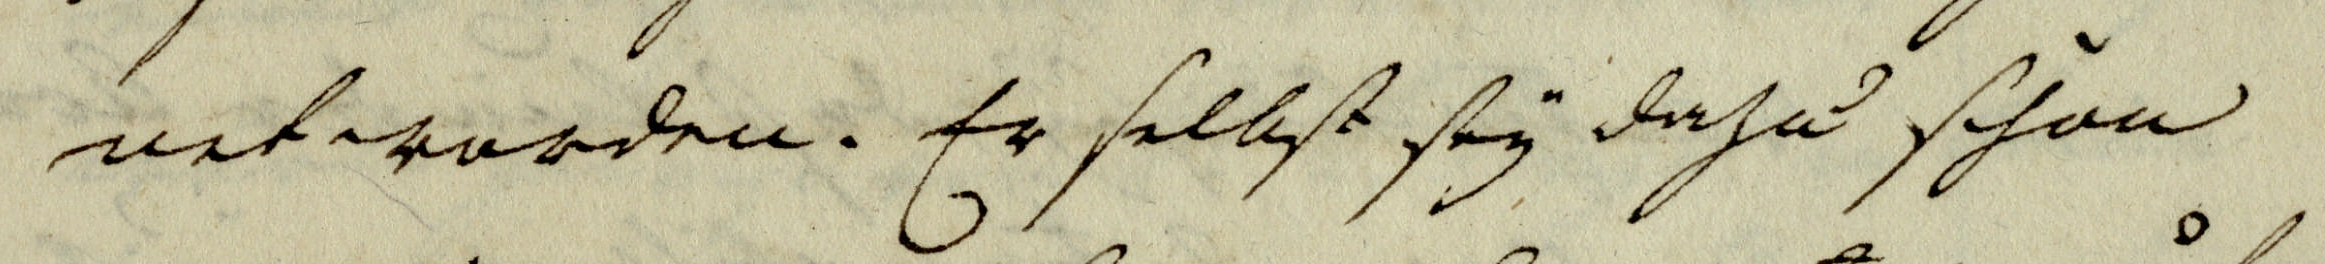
net worden. Er selbst seÿ dazu schon
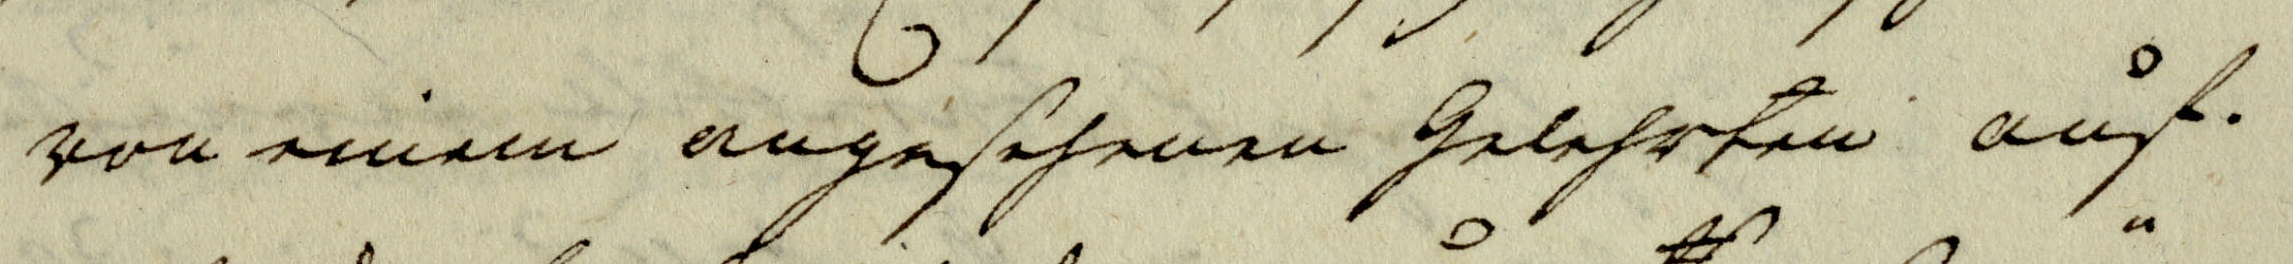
von einem angesehenen Gelehrten auf¬
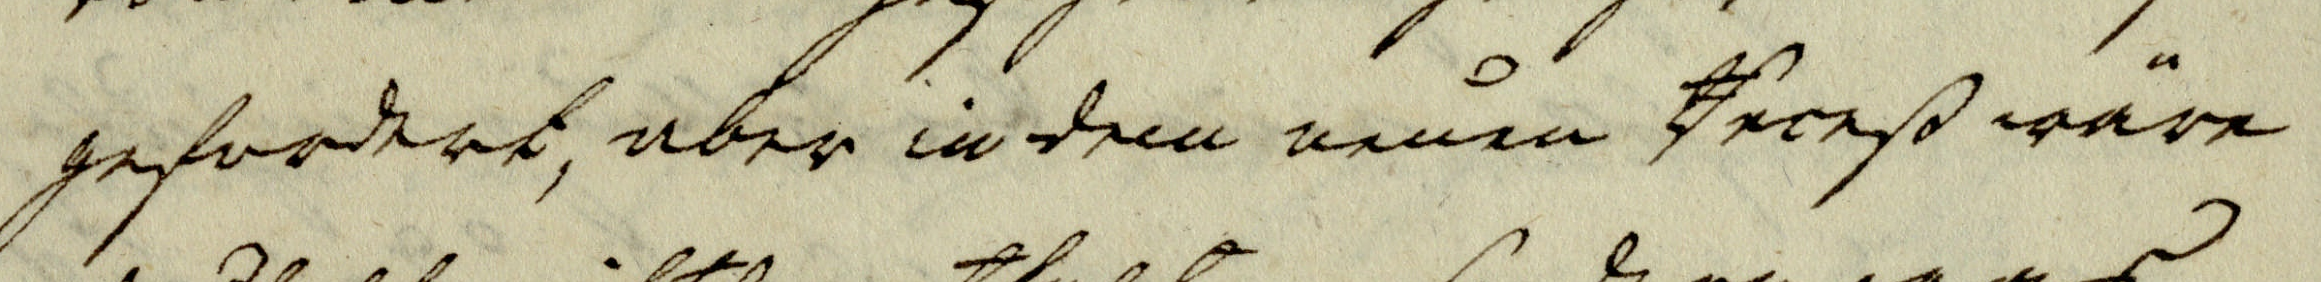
gefordert, aber in dem neuen Receß wäre
